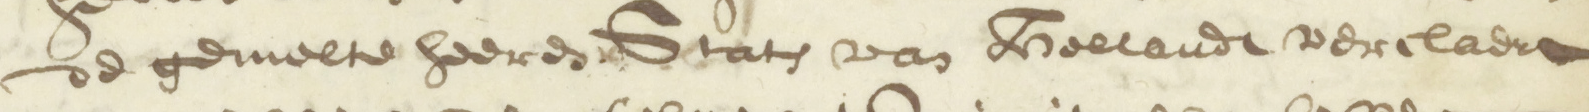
de gemelte heeren Staten van Hollandt verclaert
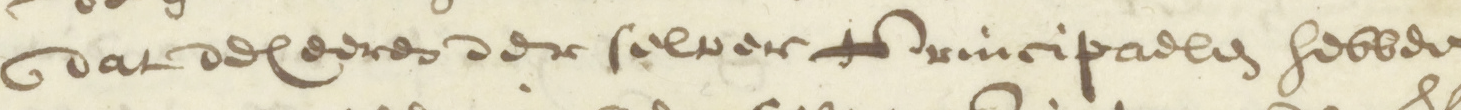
dat de heeren der selver Principaelen hebben
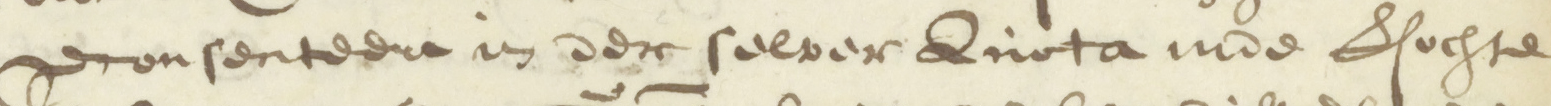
geconsenteert in der selver Quota inde Vsochte
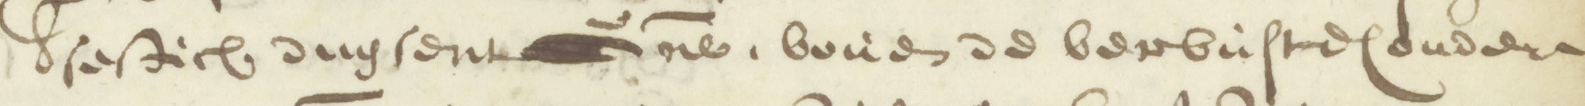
sestich duysent gul. bouen de bewuste hondert
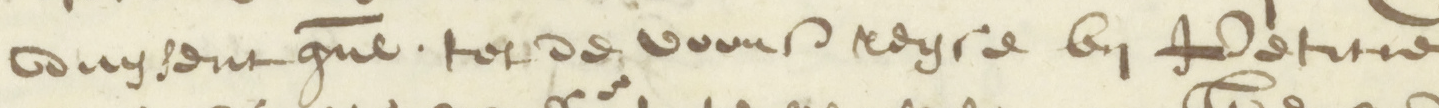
duysent gul. tot de voors reyse by Petitie
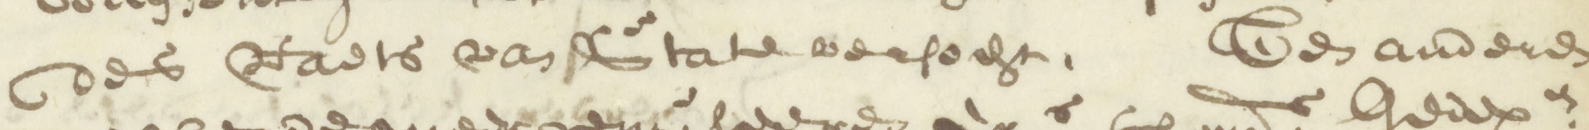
des Raets van State versocht. Ten anderen
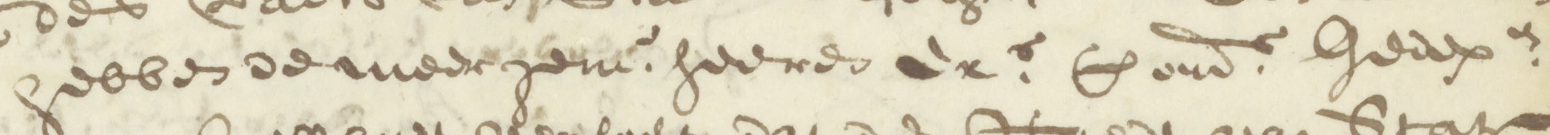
hebben de meer geme. heeren Exs. & ordr. Gedepen.
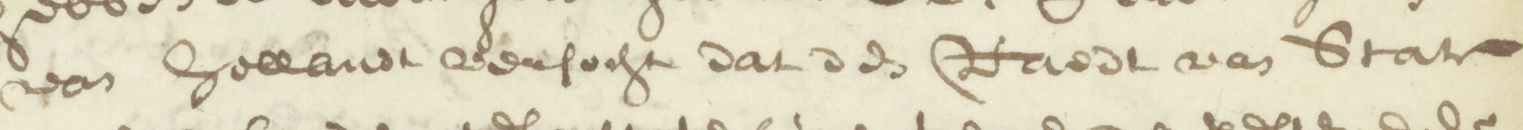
van Hollandt versocht dat den Raedt van State
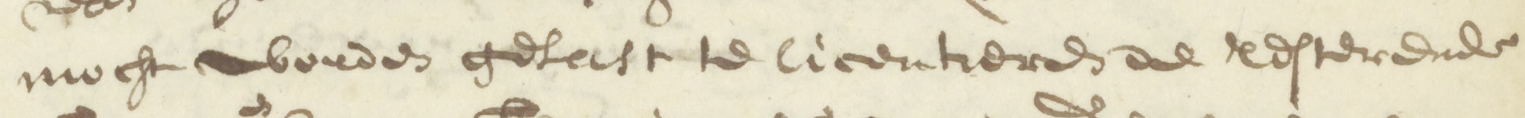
mocht worden gelast te licentieren de resterende
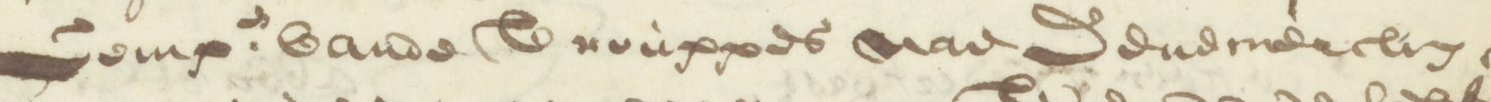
Compen. vande Trouppes nae Denemercken
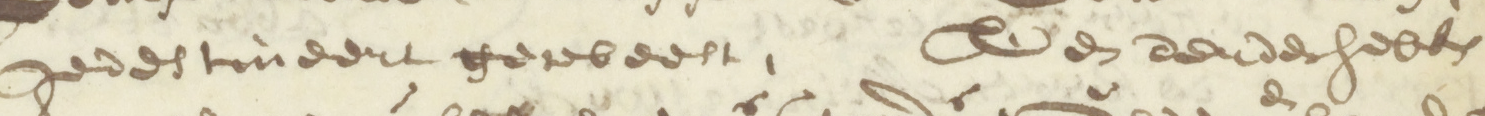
gedestineert geweest. Ten derden hebben
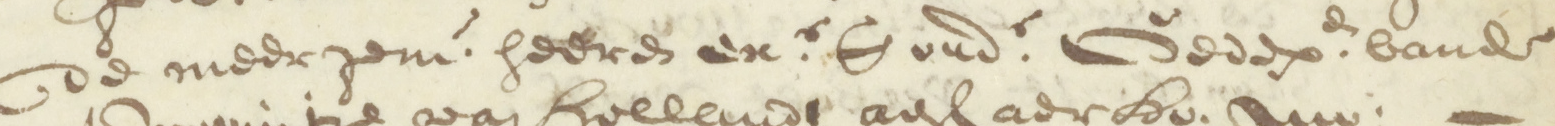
de meer geme. heeren exs. & ords. Gedepen. vande
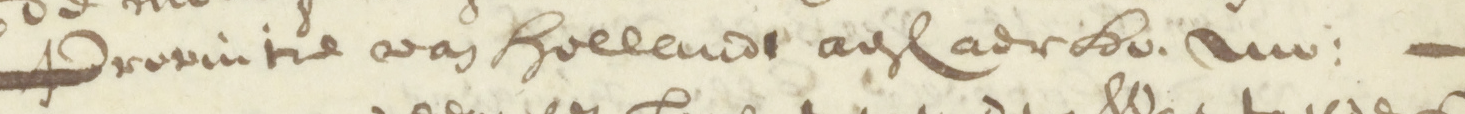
Provintie van Hollandt aen haer Ho:Mo: -
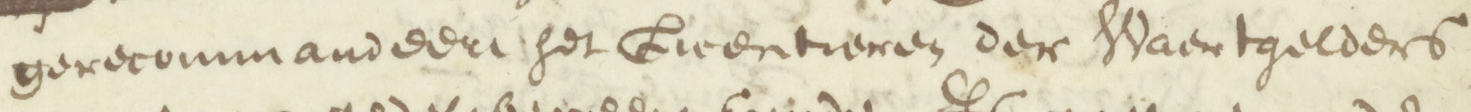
gerecommandeert het Licentieren der Waertgelders.
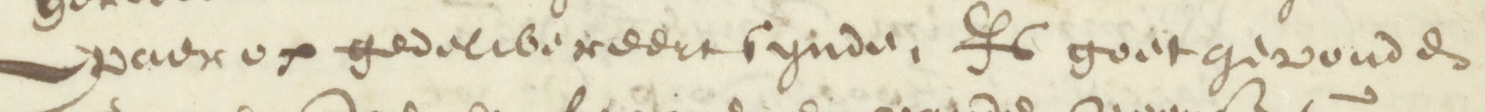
Waerop gedelibereert synde, Is goetgevonden
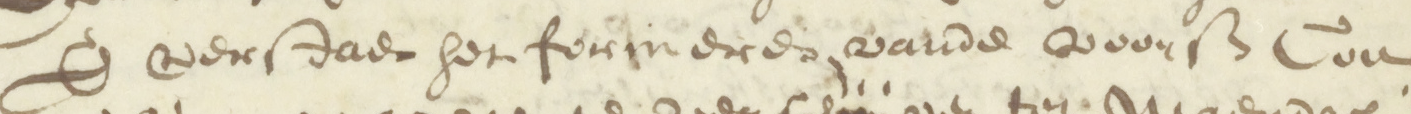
& verstaen het formeren vande voors Con„
